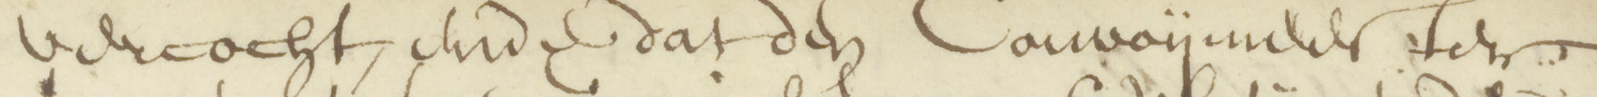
vercocht, ende dat den Convoijmeester
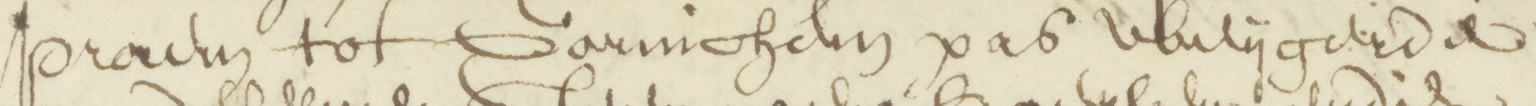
Praem tot Gornichem pas weijgerde
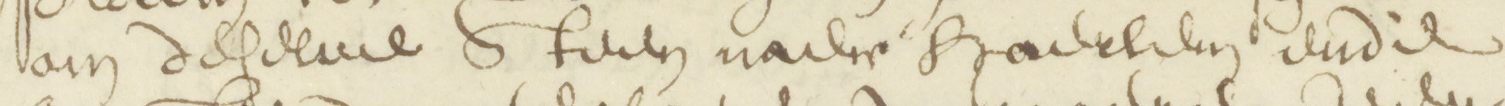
om deselve Steen naer Haerlem ende
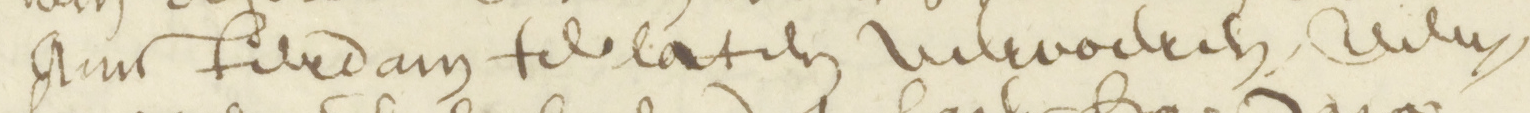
Amsterdam te laten vervoeren, ver„
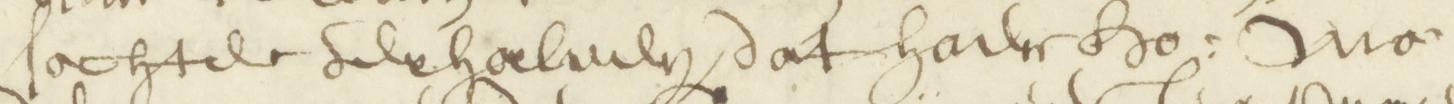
sochte derhalven, dat haer Ho:Mo:
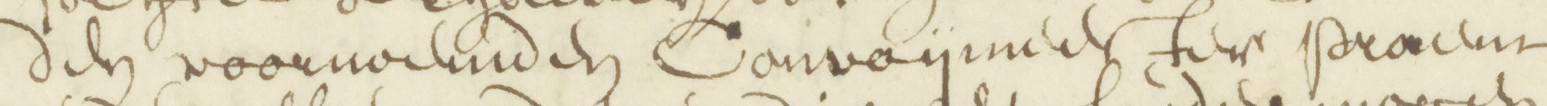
den voornoemden Convoijmeester Praem
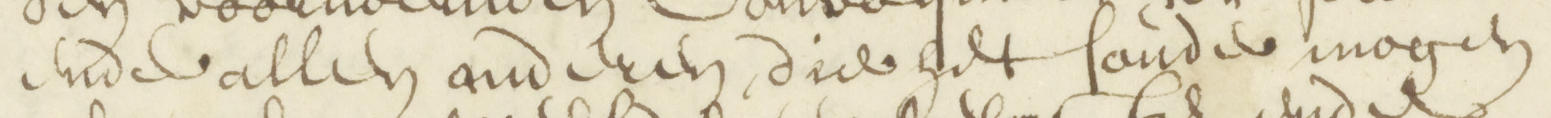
ende allen anderen, die het soude mogen
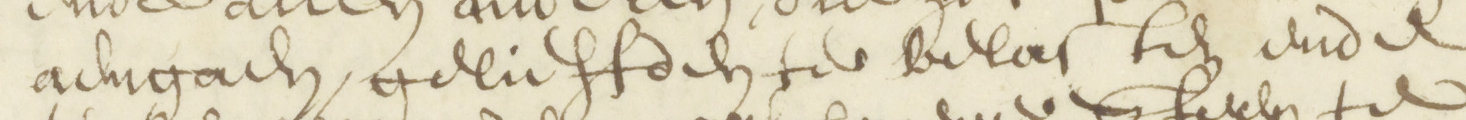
aengaen, gelieffden te belasten ende
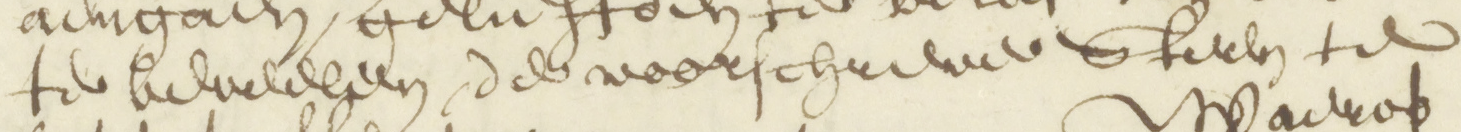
te beveelen, de voorschreve Steen te
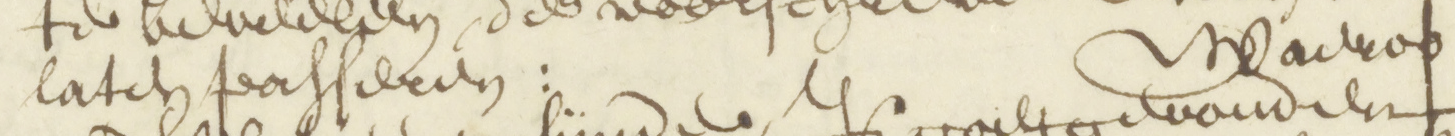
laten passeren: Waerop
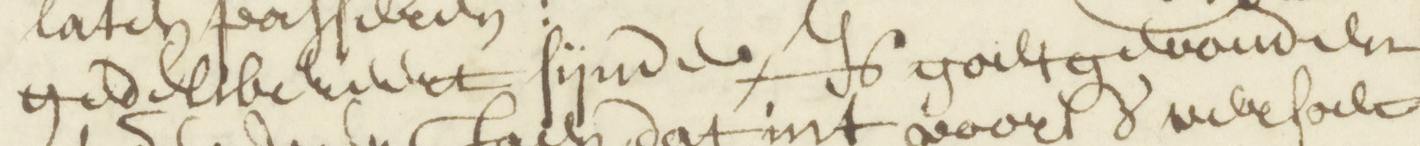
gedelibereert sijne, Is goetgevonden
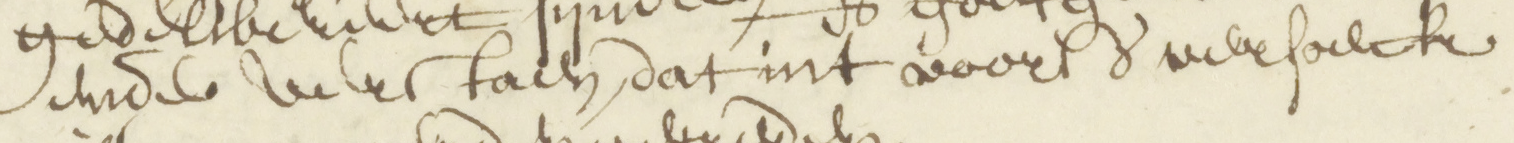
ende verstaen, dat int voors versoeck
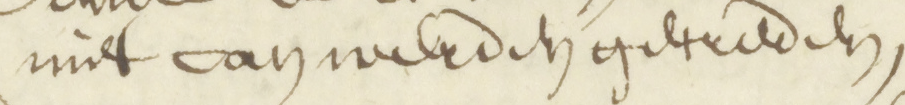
niet can werden getreden.
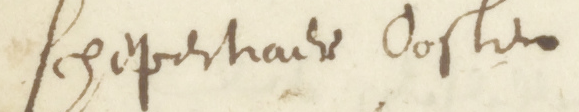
schepen naer Oosten
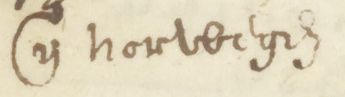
& Norwegen
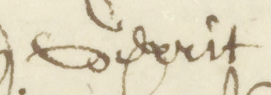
Gerrit
